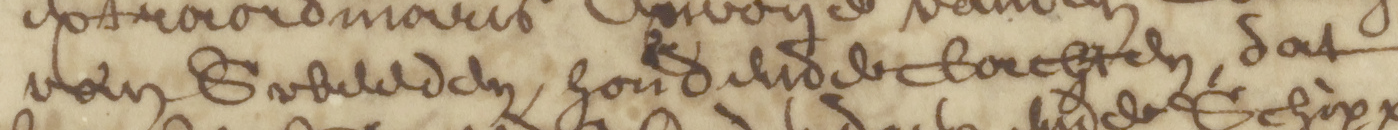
van Sweeden, houdende clachten, dat
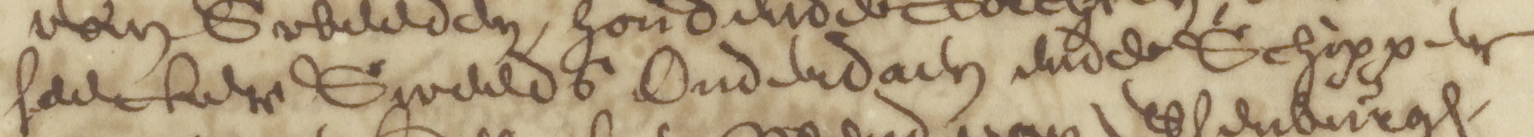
seecker Sweeds Onderdaen ende Schipper
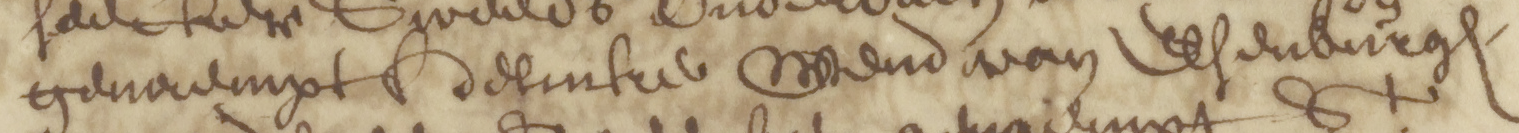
genaempt Helmke Mend van Elsenburgh,
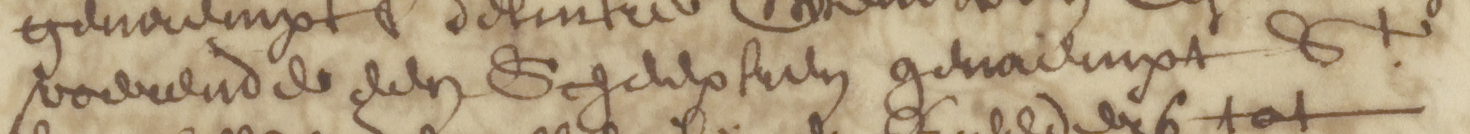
voerende een Scheepken genaempt St.
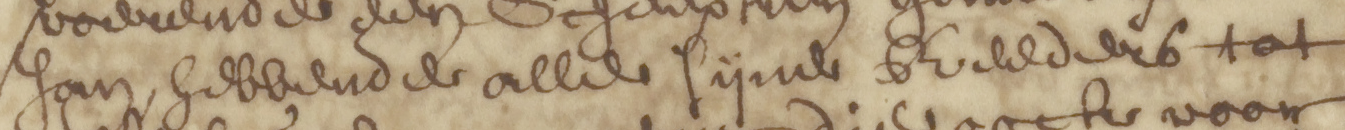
Jan, hebbende alle sijne Reeders tot
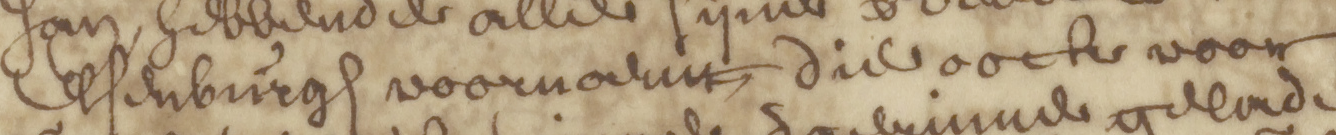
Elsenburgh voornoemt, die oock voor
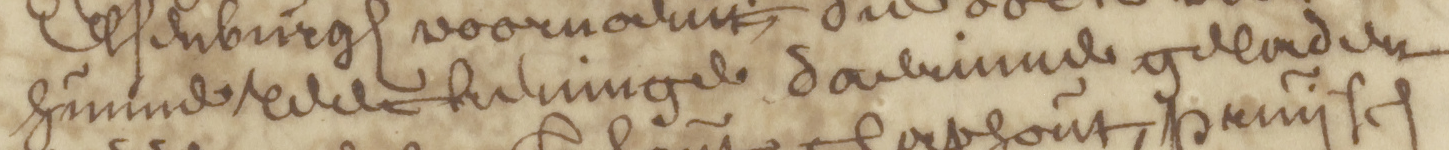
hunne reeckeninge daerinne geladen
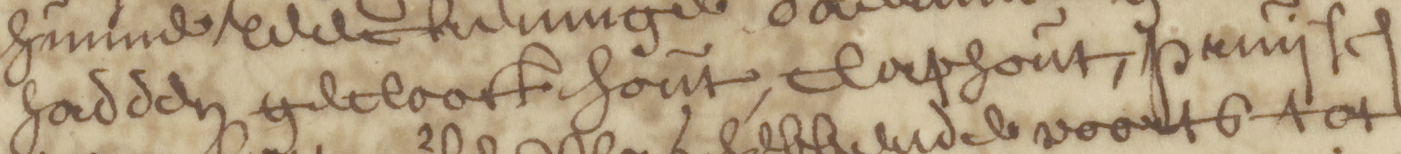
hadden geclooft hout, claphout, pruijsch
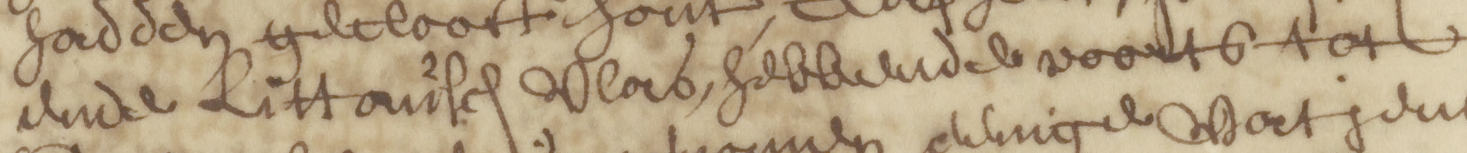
ende Littausch vlas, hebbende voorts tot
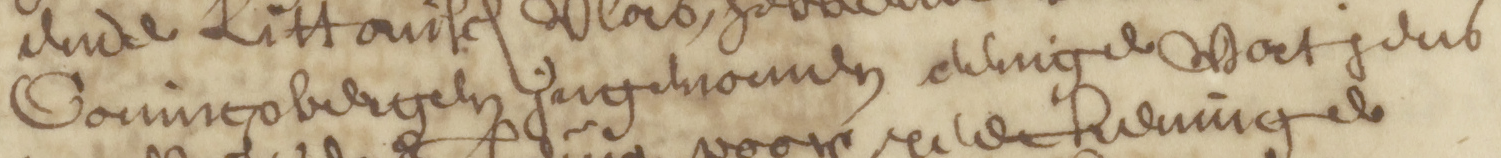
Conincxbergen ingenomen eenige vatjens
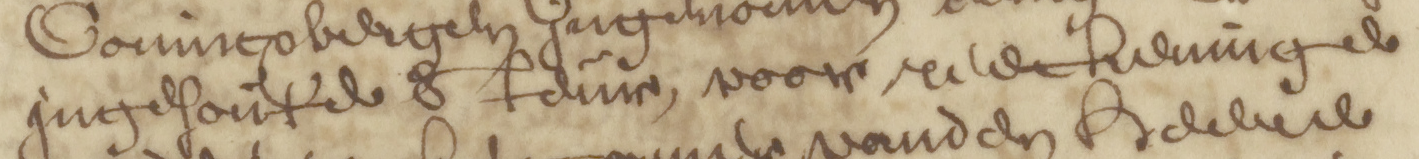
ingesoute Steur, voor reeckeninge
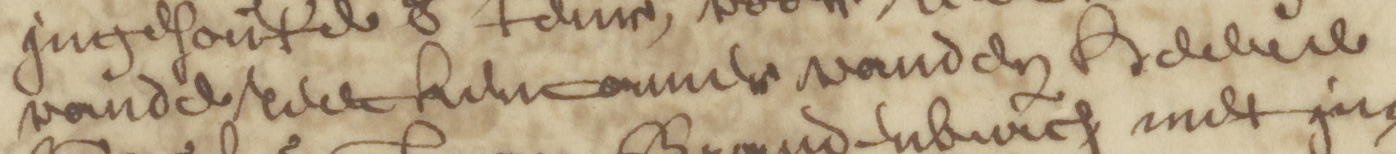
vande reeckencamer vanden Heere
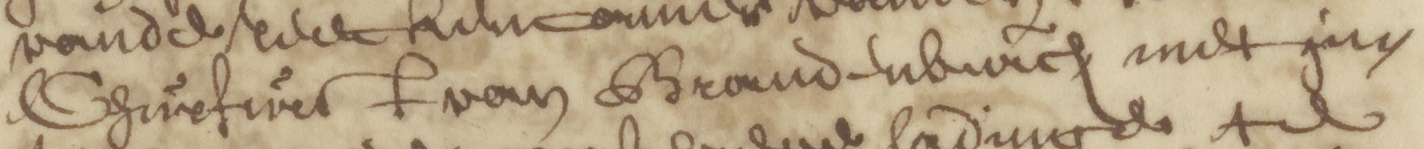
Churfurst van Brandenburch, met in,,
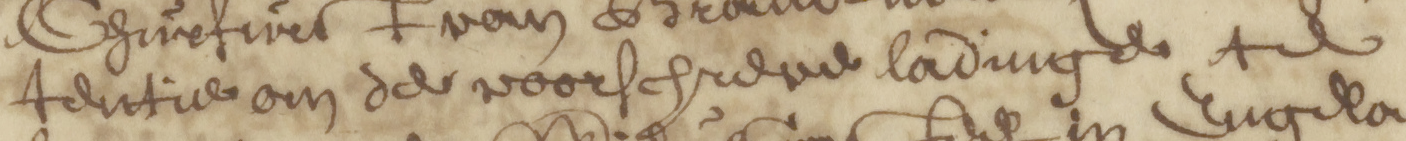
tentie om de voorschreve ladinge te
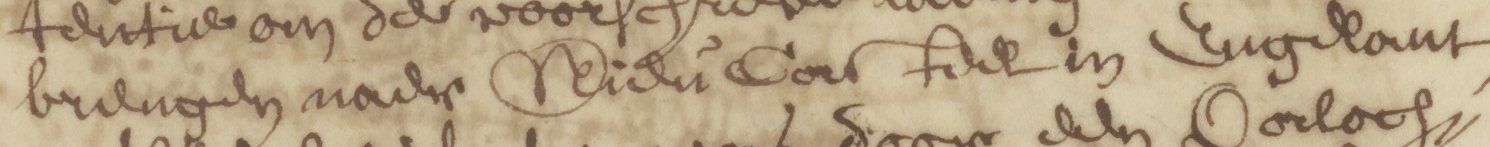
brengen naer NieuCasteel in Engelant,
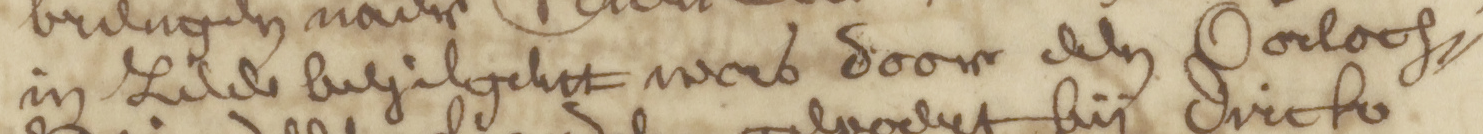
in Zee bejegent was door een Oorloch,,
